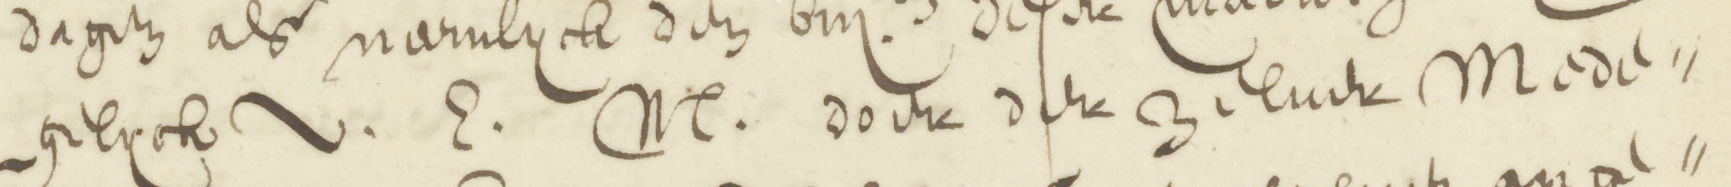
gelyck U. E. M. doer der zelUer Mede„
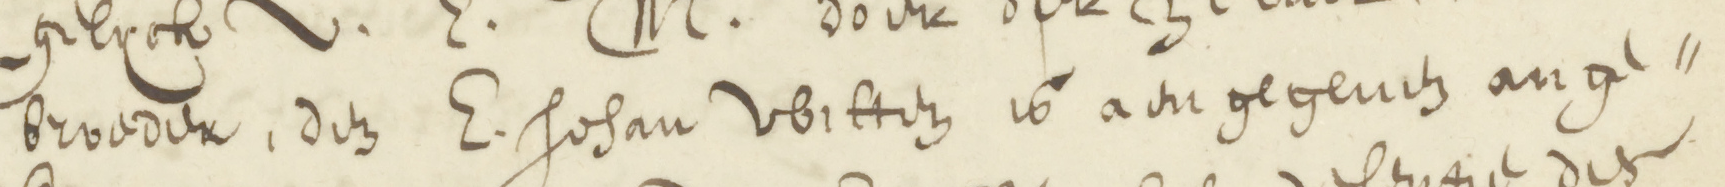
broeder, den E. Johan Witten is aengegeUen ange„
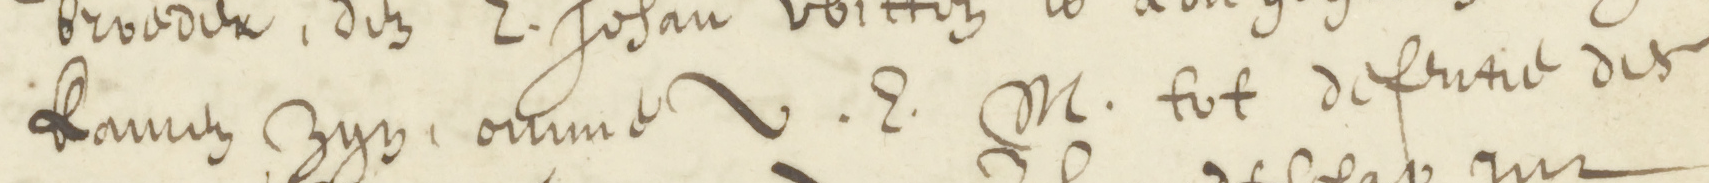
komen zyn, omme U. E. M. tot desentie des
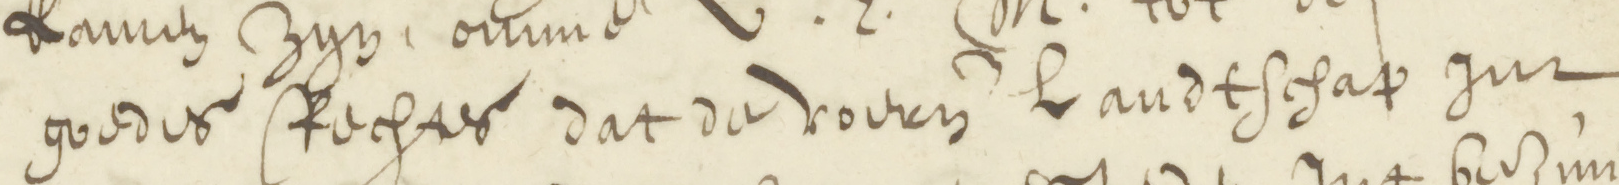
goedes Rechtes dat de voern Landtschap Int
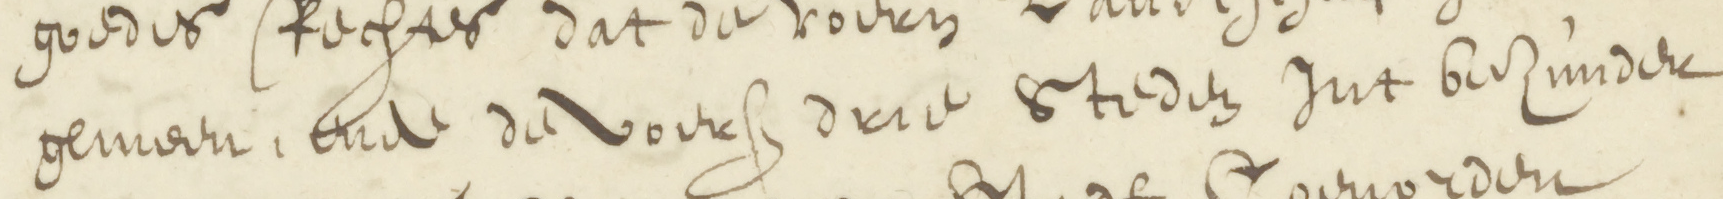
gemeen, ende de voers drie steden Int bezunder
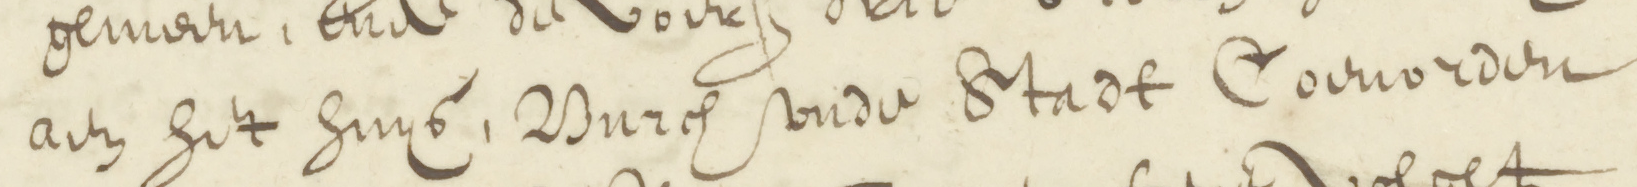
aen het huys, Burch ende Stadt Coevorden
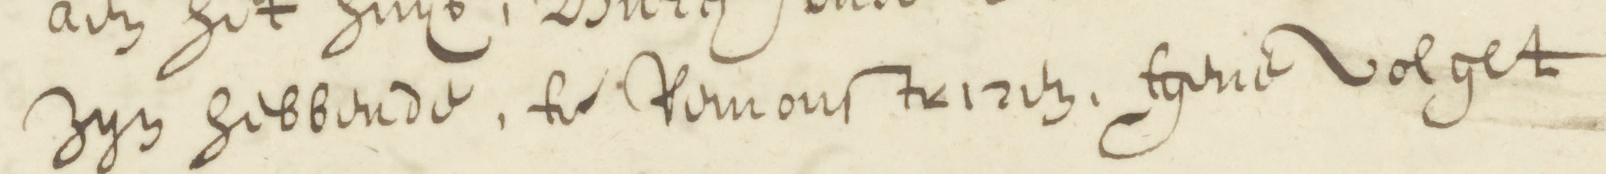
zyn hebbende, te Remonstriren, tgene volght
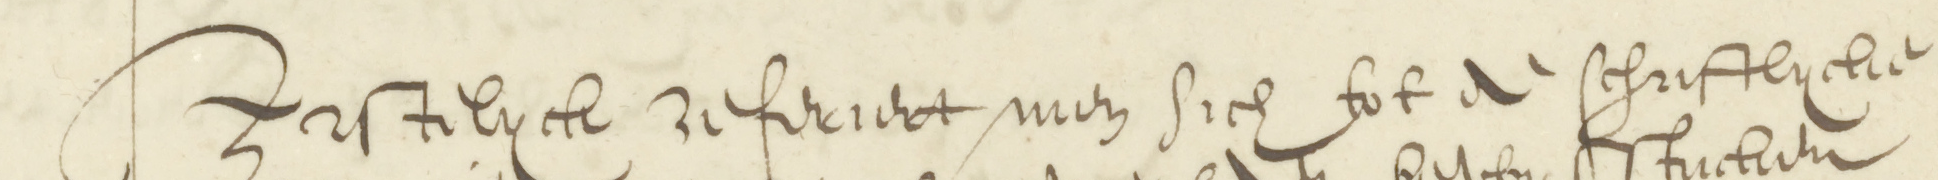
Irstelyck referiert, men sich tot de schriftlycke
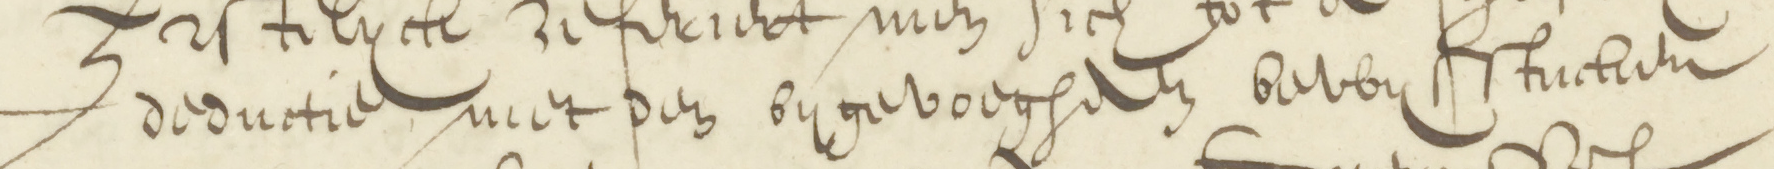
deductie, met den bygevoeghden bewysstucken
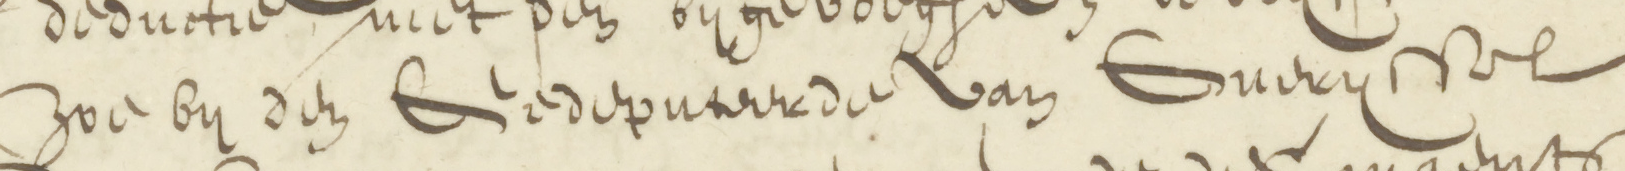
zoe by den Gedeputeerde van Oueryssel
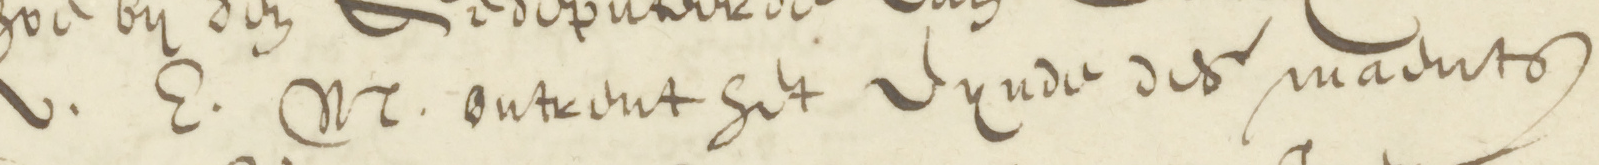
U. E. M. ontrent het eynde des maents
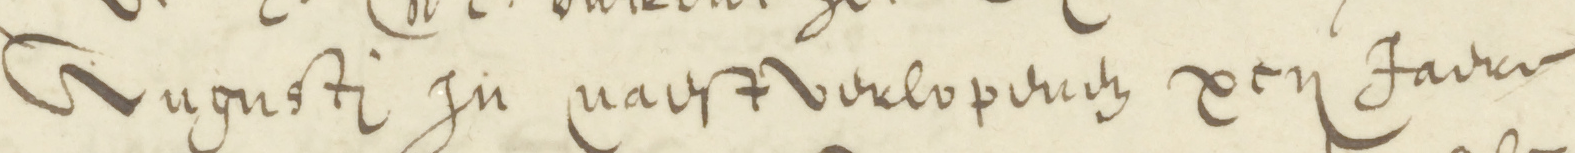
Augusti In naestverlopenen xcij jaere
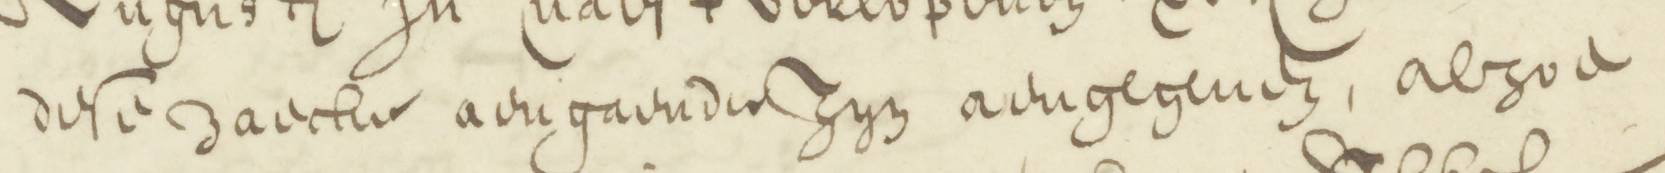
dese zaecke aengaende zyn aengegeuen, alzoe
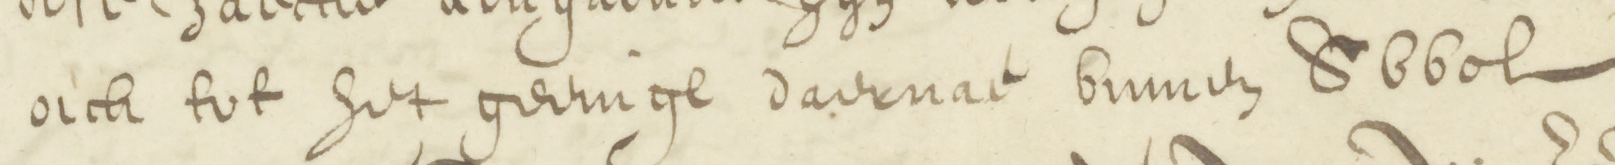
oick tot het geenige daernae binnen Swol
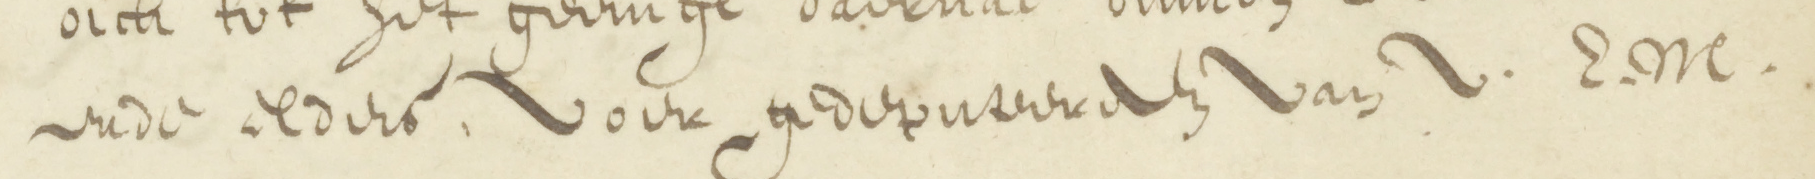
ende elders, voer gedeputeerden van U. E. M.
